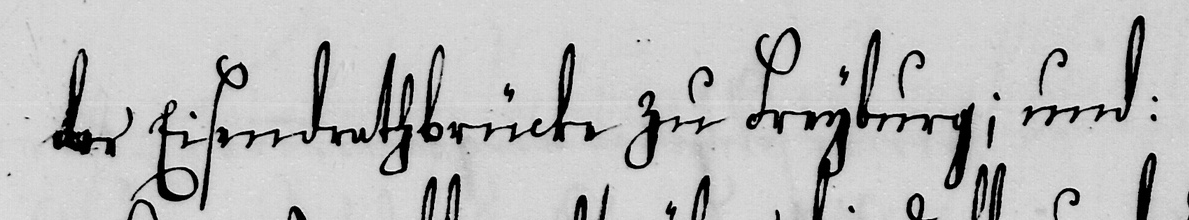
der Eisendrahtbrücke zu Freyburg; und:
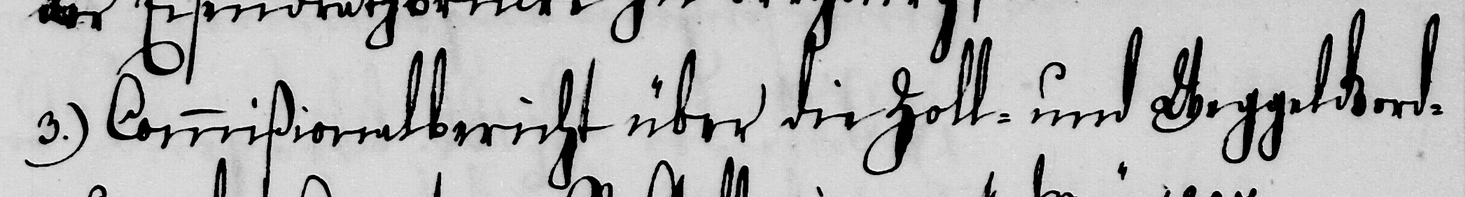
3.) Commißionalbericht über die Zoll- und Weggeldsord¬
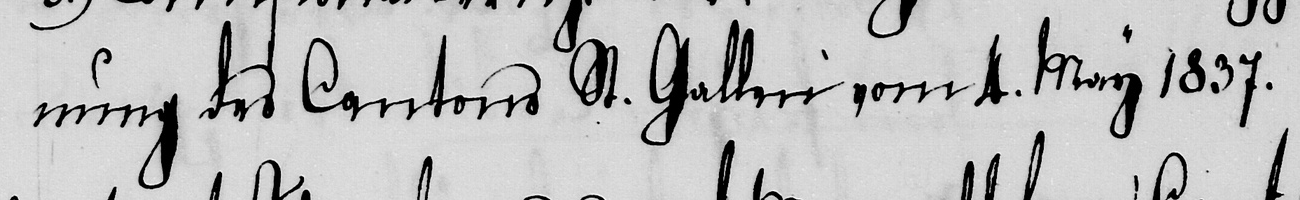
nung des Cantons St. Gallen vom 4. März 1837.
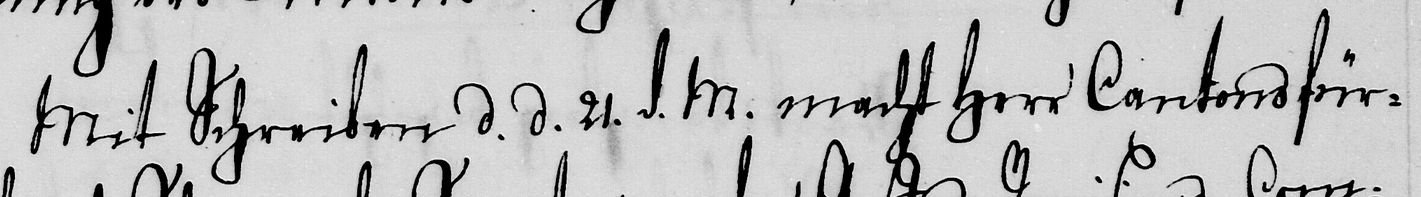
Mit Schreiben d. d. 21. d. M. macht Herr Cantonsfür¬
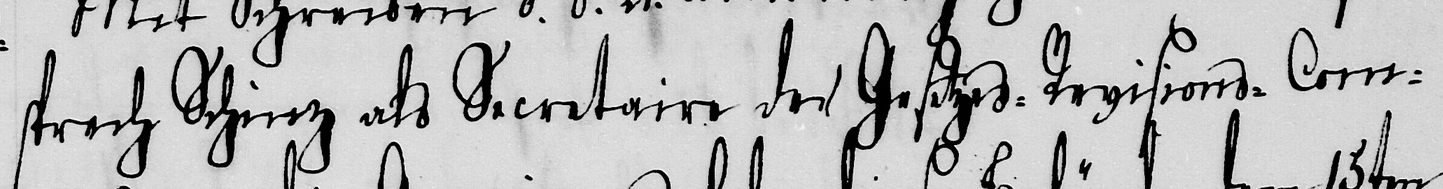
sprech Schinz als Secretaire der Gesetzes-Revisions-Com¬
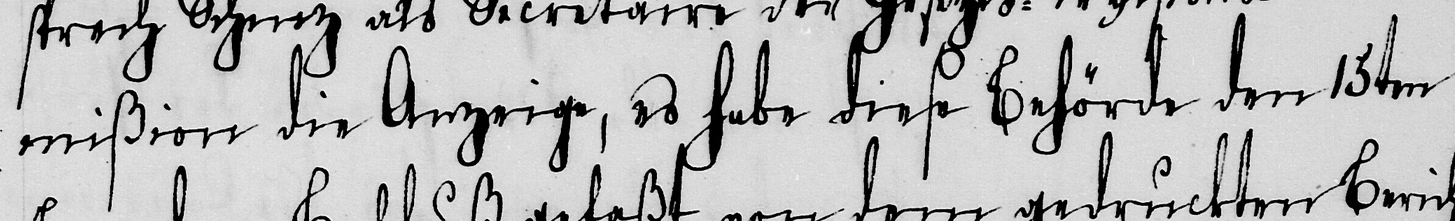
mißion die Anzeige, es habe diese Behörde den 15ten
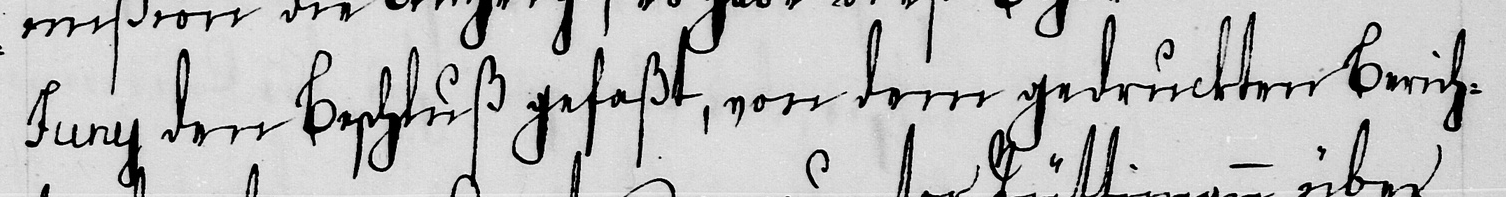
Juny den Beschluß gefaßt, von dem gedruckten Berich¬
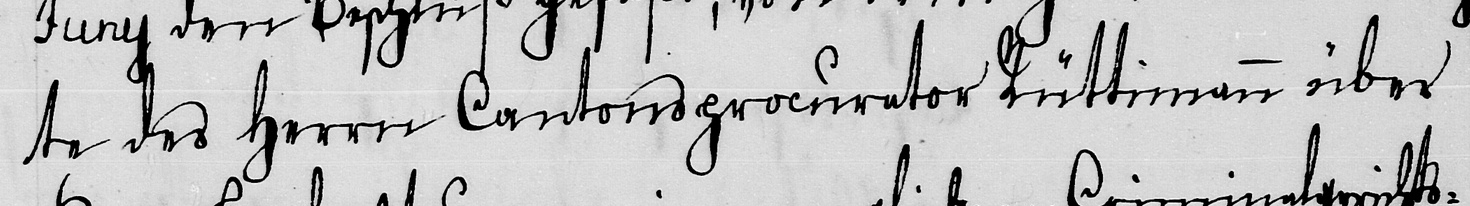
te des Herrn Cantonsprocurator Rüttimann über
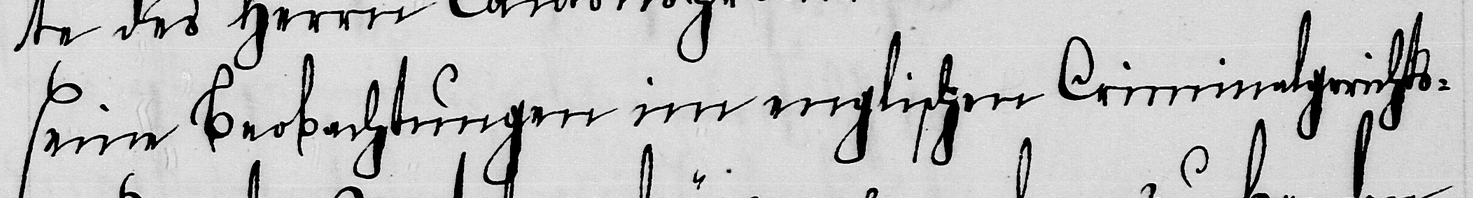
seine Beobachtungen im englischen Criminalgerichts¬
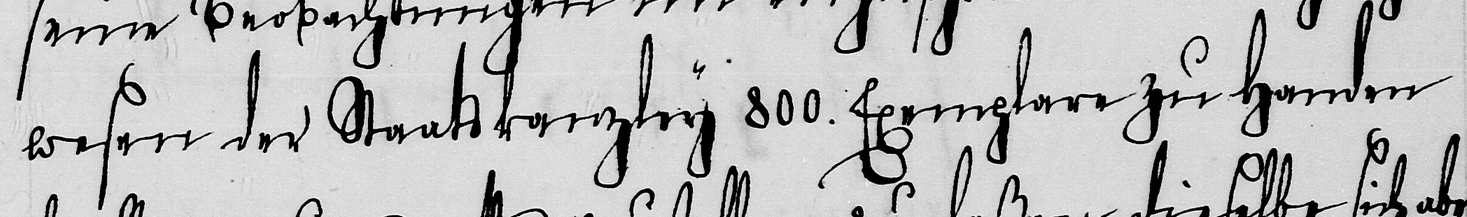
wesen der Staatskanzley 800. Exemplare zu Handen
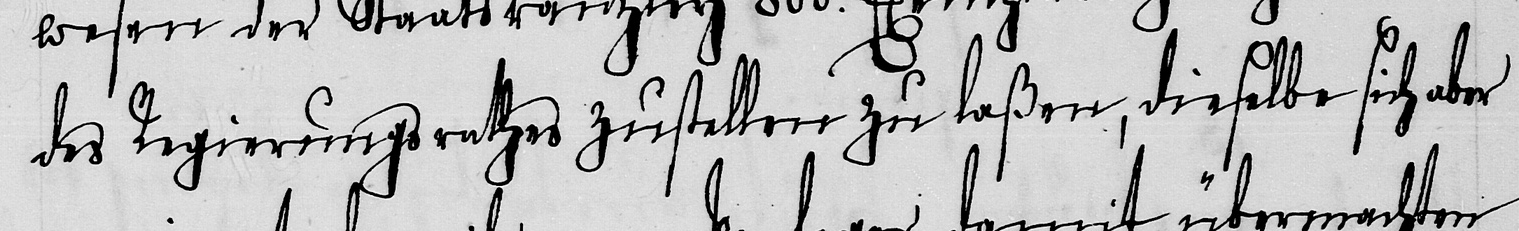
des Regierungsrathes zustellen zu laßen, dieselbe sich aber
